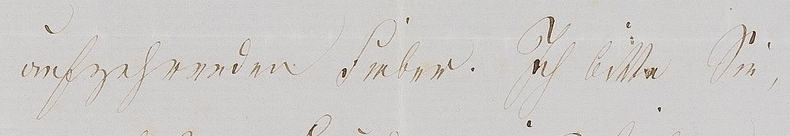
aufzehrenden Fieber. Ich bitte Sie,
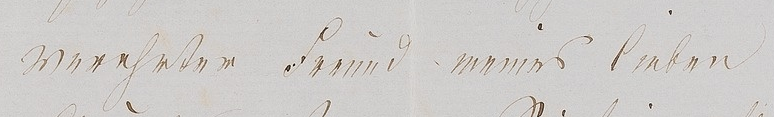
verehrter Freund meines lieben
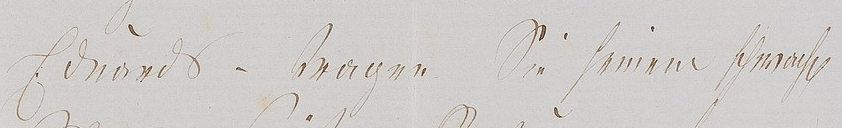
Eduards – Tragen Sie seinem schwachen
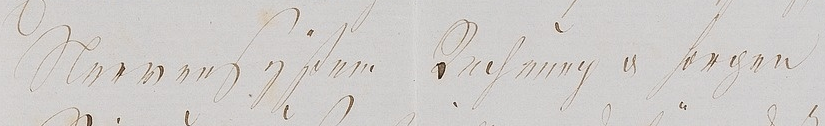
Nervensystem Rechnung & sorgen
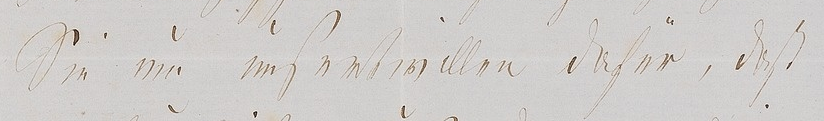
Sie um unsertwillen dafür, daß
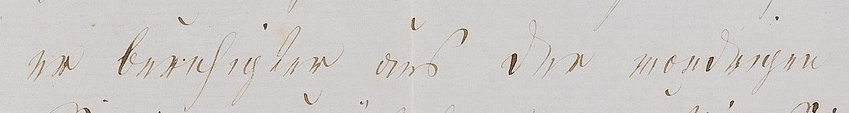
er beruhigter aus der mondrigen
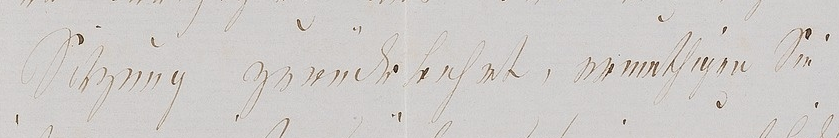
Sitzung zurück kehrt, ermuthigen Sie
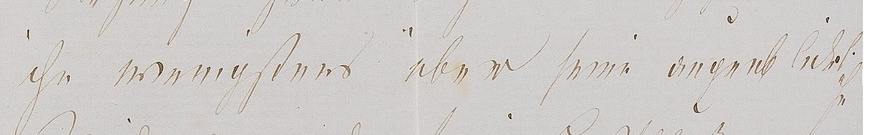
ihn wenigstens über seine augenblickliche
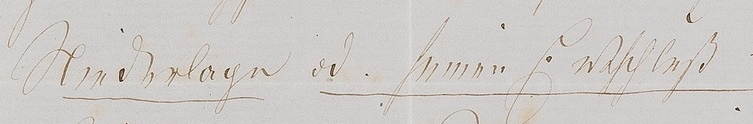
Niederlage od. seinen Entschluß –
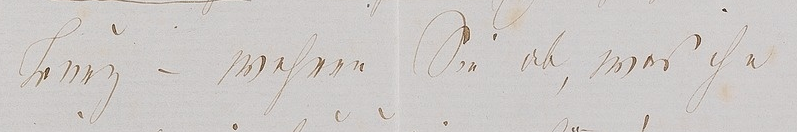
kurz – wehren Sie ab, was ihn
